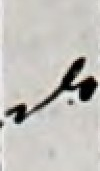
do
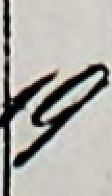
19
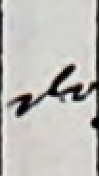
do
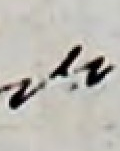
do
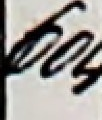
604
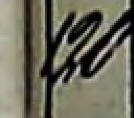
120
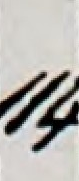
114
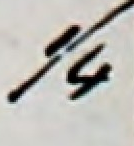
1/4
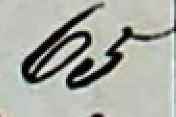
65
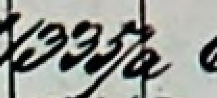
1335/a
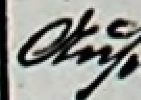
Aus„
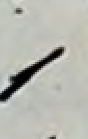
1
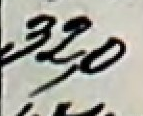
32,0
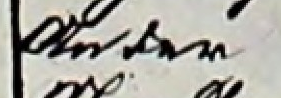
An der
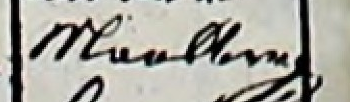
Marsberg„
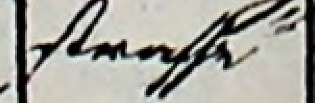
straffe
